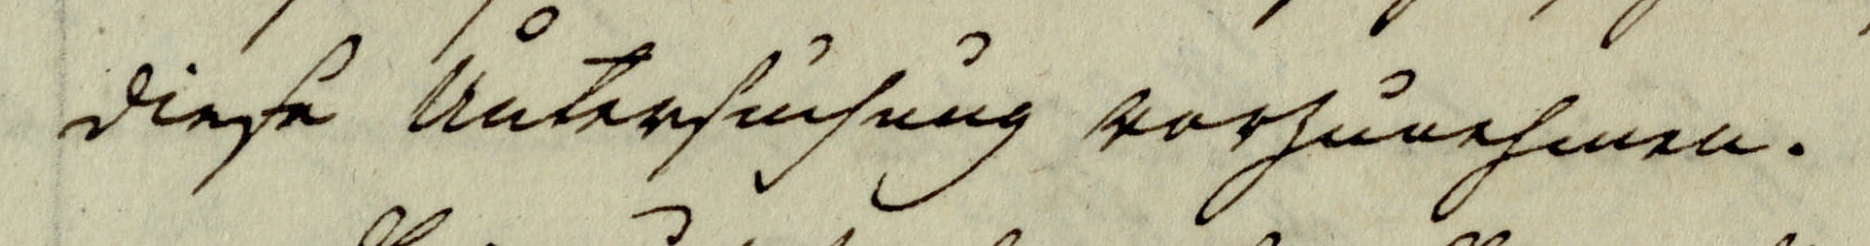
diese Untersuchung vorzunehmen.
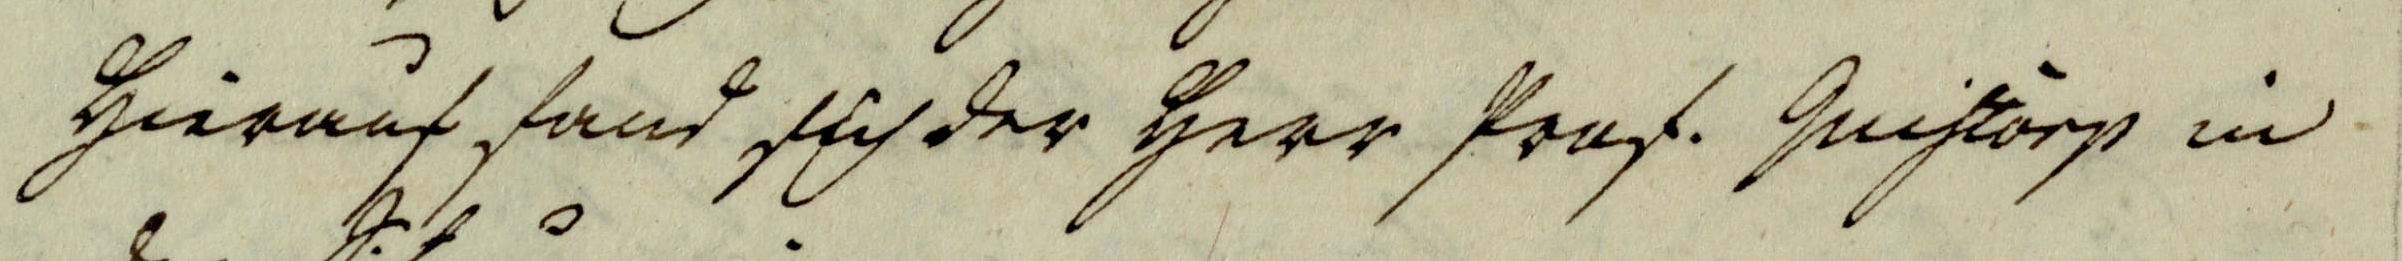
Hierauf fand sich der Herr Prof. Quistorp in
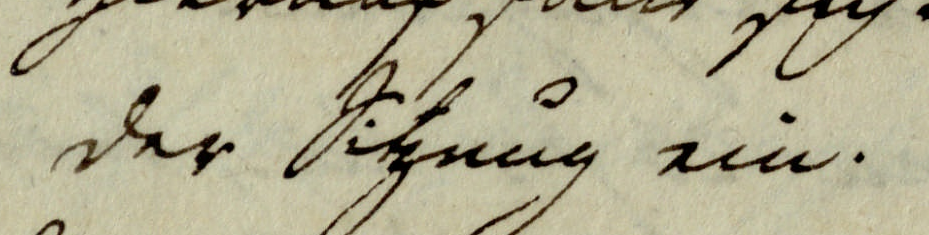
der Sitzung ein.
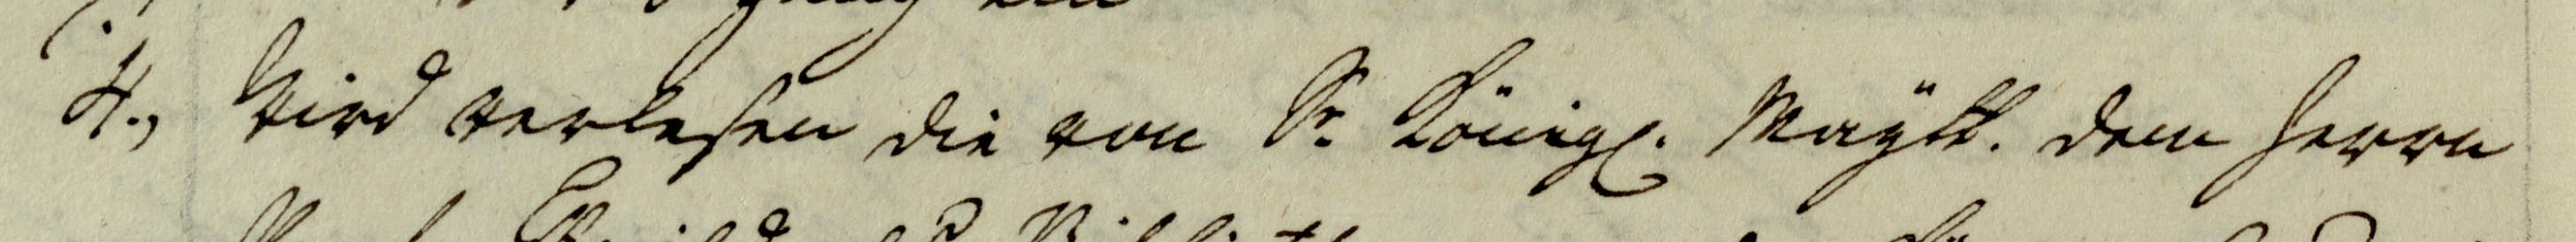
4. Wird verlesen die von Sr. Königl. Maÿtt. dem Herrn
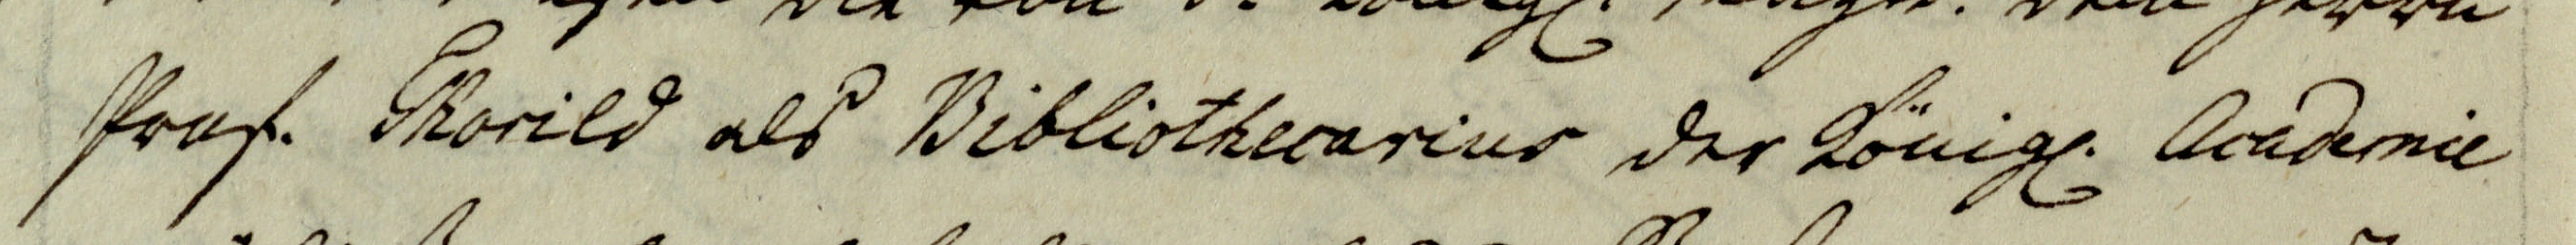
Prof. Thorild als Bibliothecarius der Königl. Academie
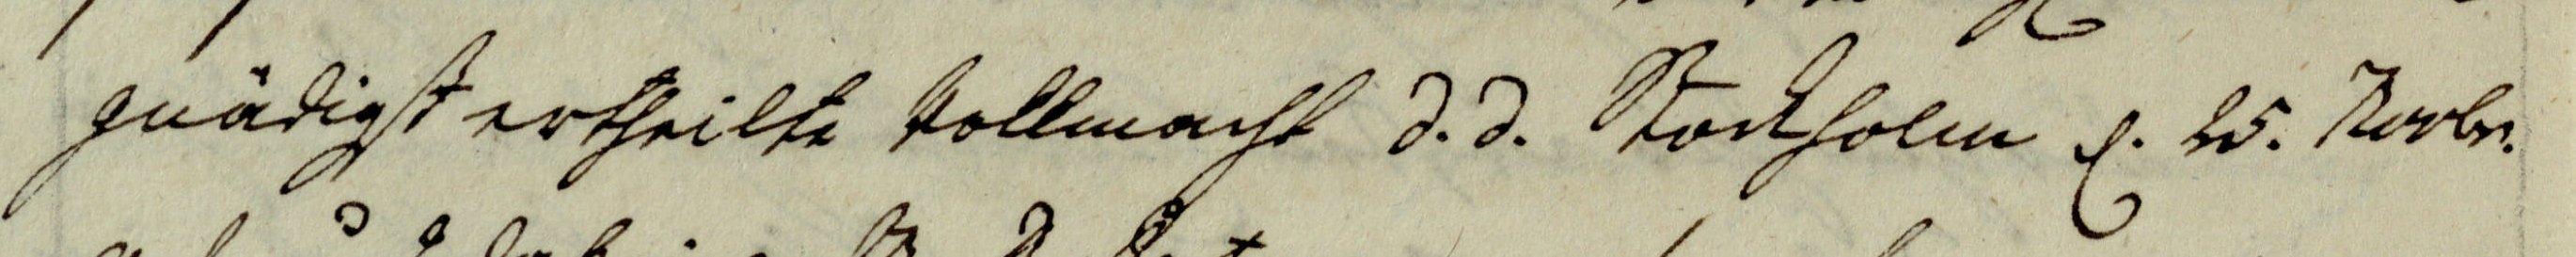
gnädigst ertheilte Vollmacht d. d. Stockholm d. 25. Novbr.
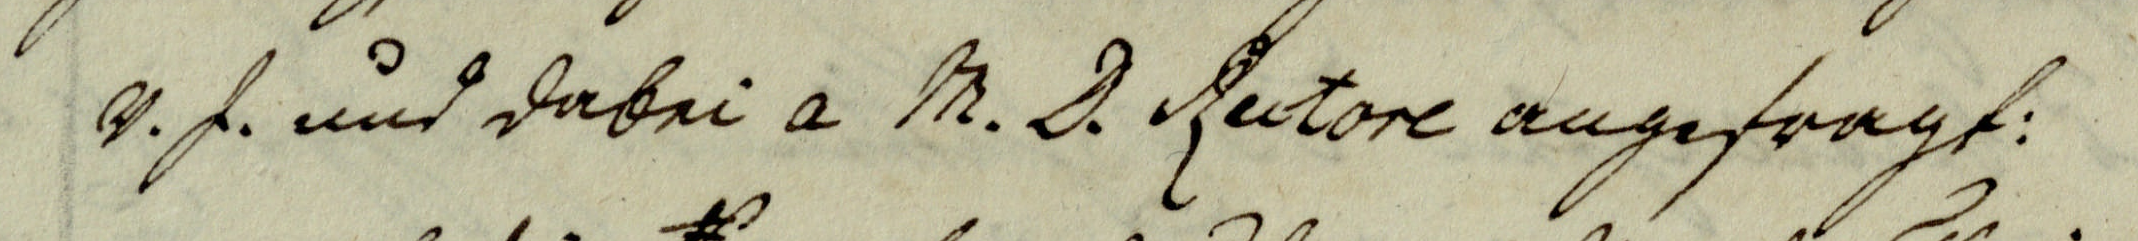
v. J. und dabei a M. D. Rectore angefragt:
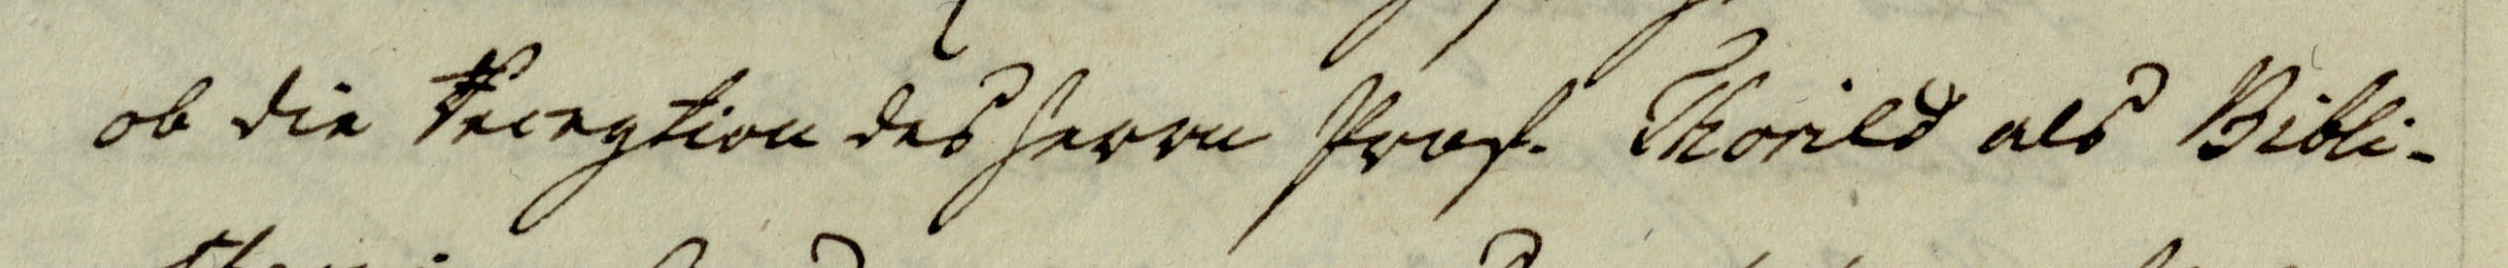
ob die Reception des Herrn Prof. Thorild als Bibli¬
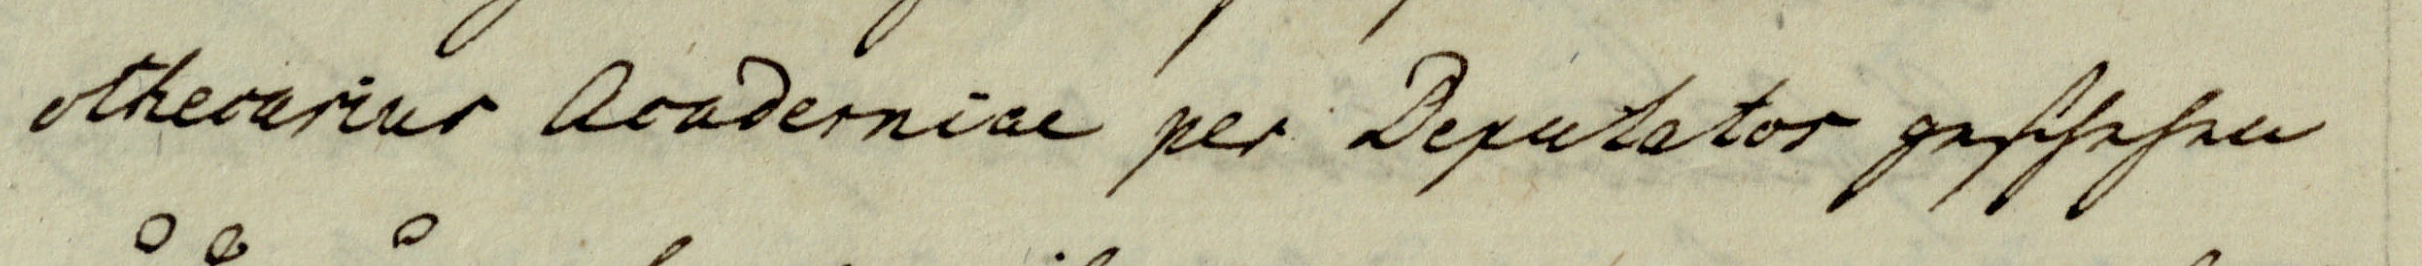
othecarius Academiae per Deputatos geschehen
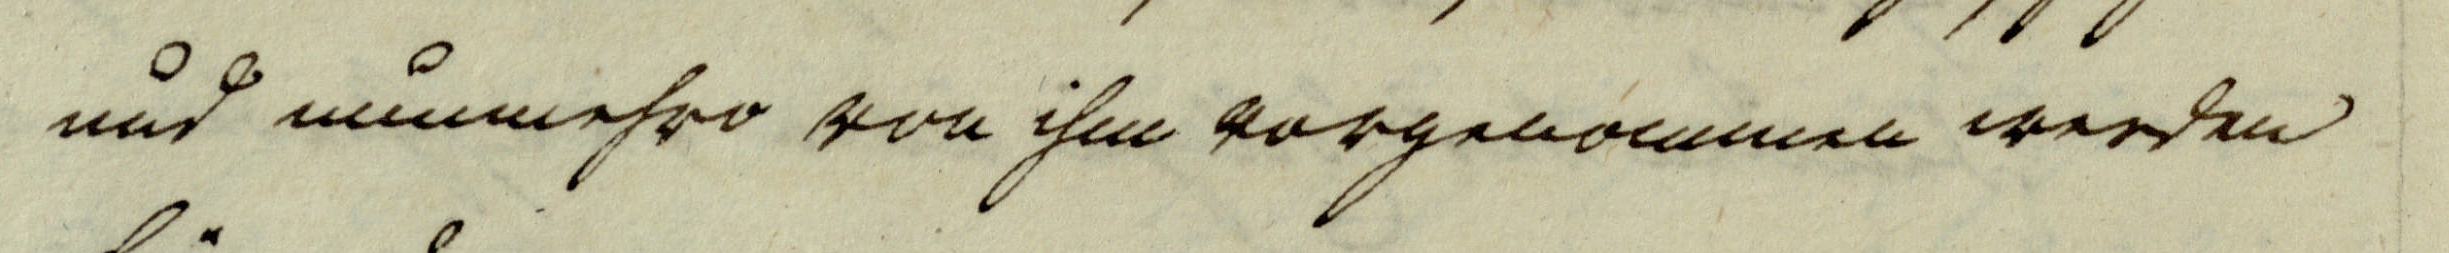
und nunmehro von ihm vorgenommen werden
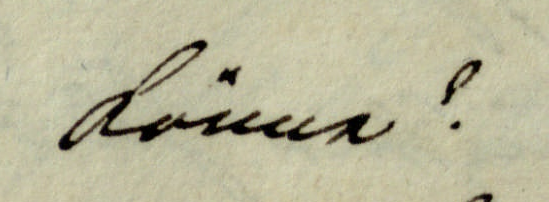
könne?
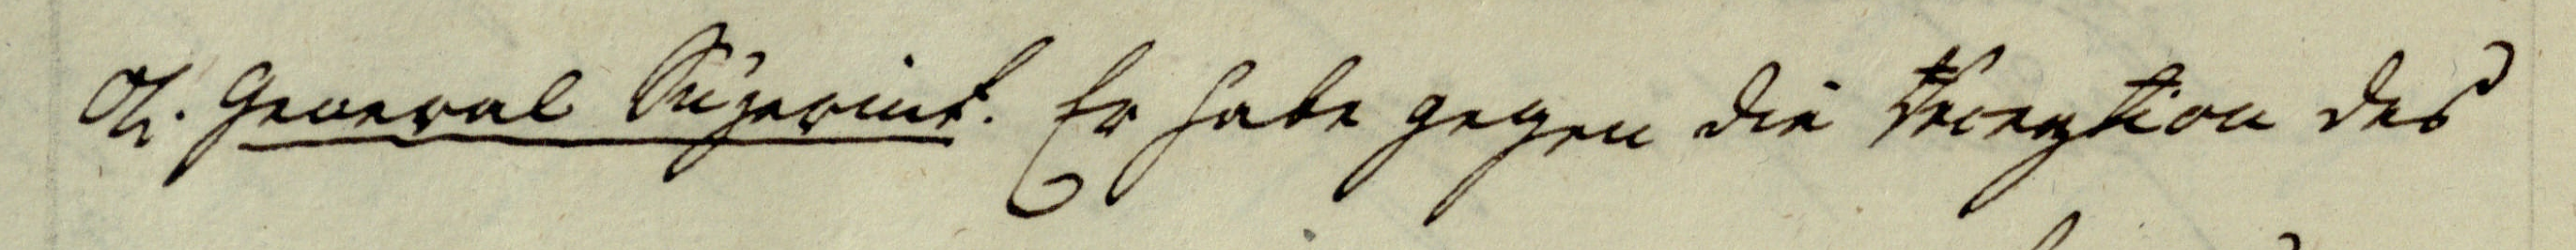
dh. General Superint. Er habe gegen die Reception des
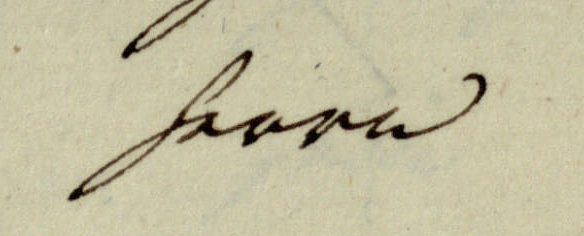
Herrn
